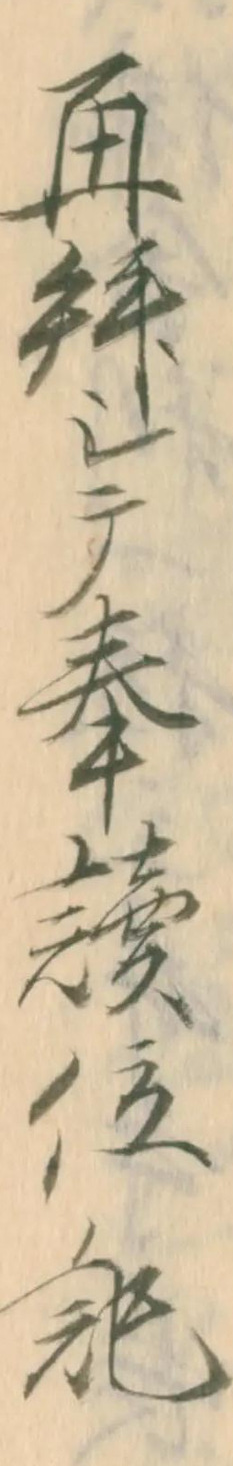再拝シテ奉読位記
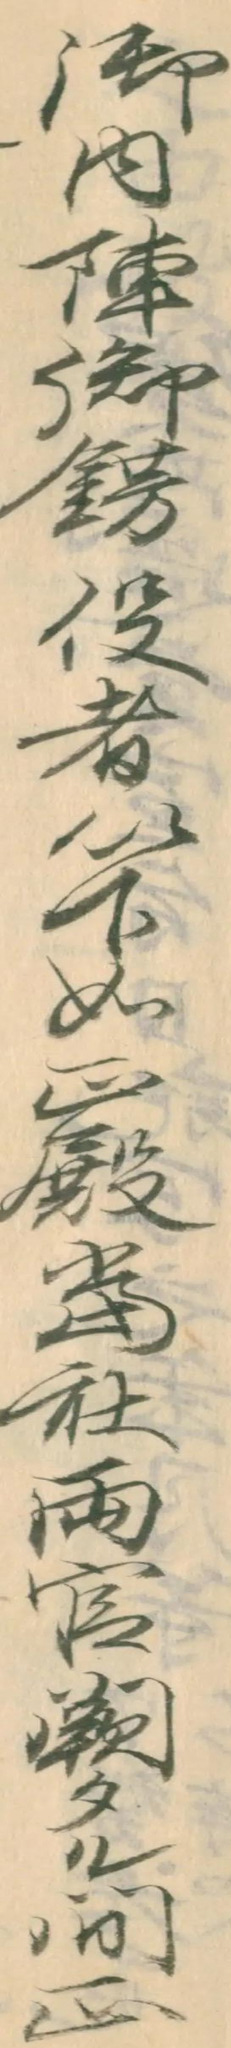御内陣御錺役者以下如正殿当社両官闕タル間正
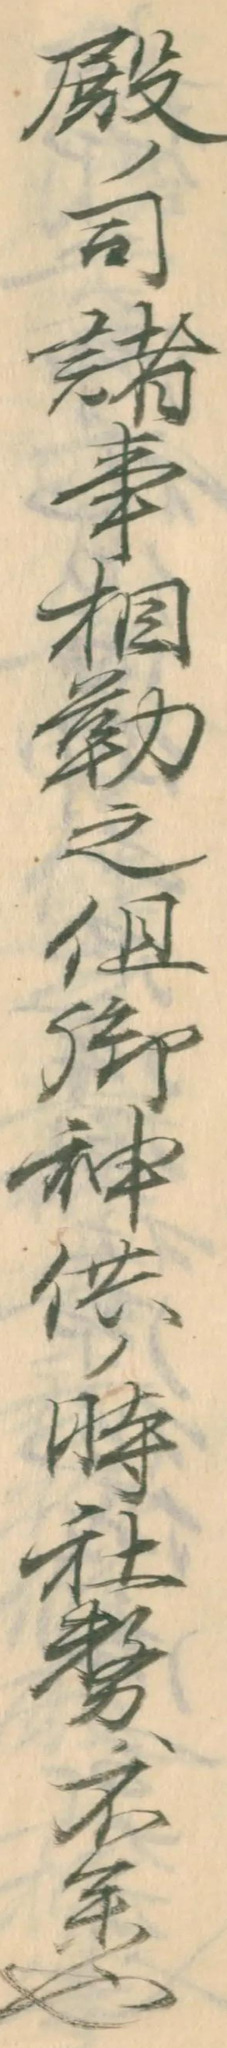殿ノ司諸事相勤之但御神供ノ時社務へ不参也
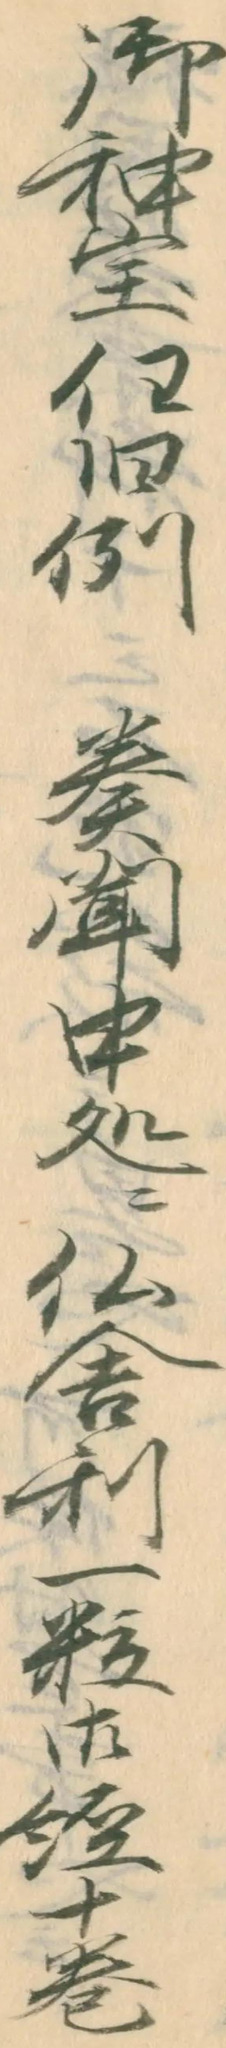御神宝任旧例奏聞申処ニ仏舎利一粒御経十巻
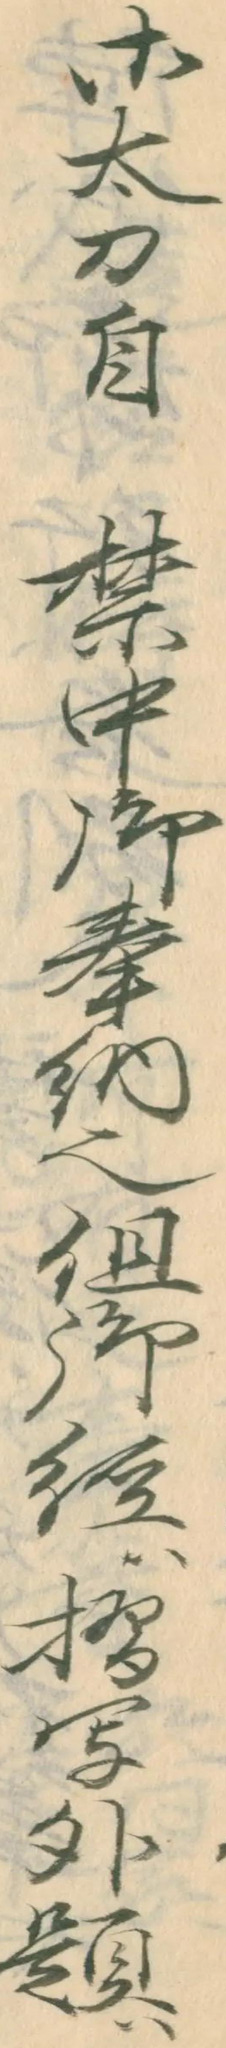等太刀自禁中御奉納也但御経ハ摺写外題ハ
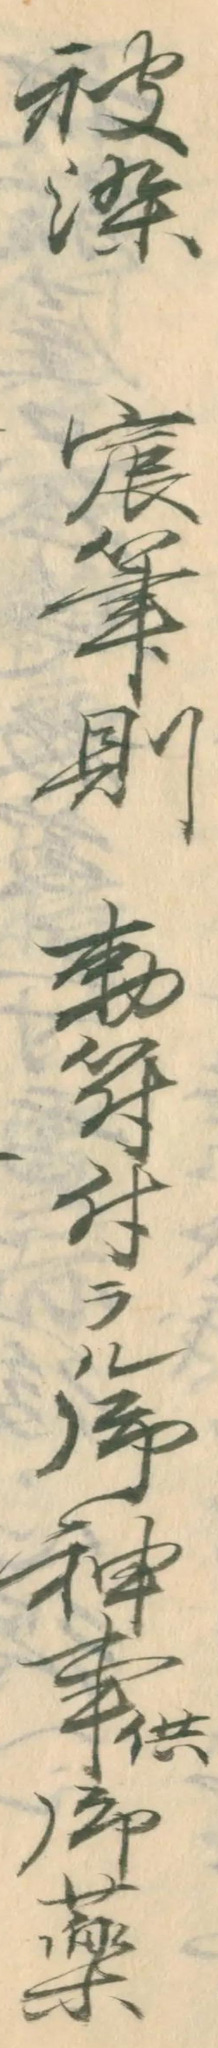被染宸筆則勅符付ラル御神事御薬
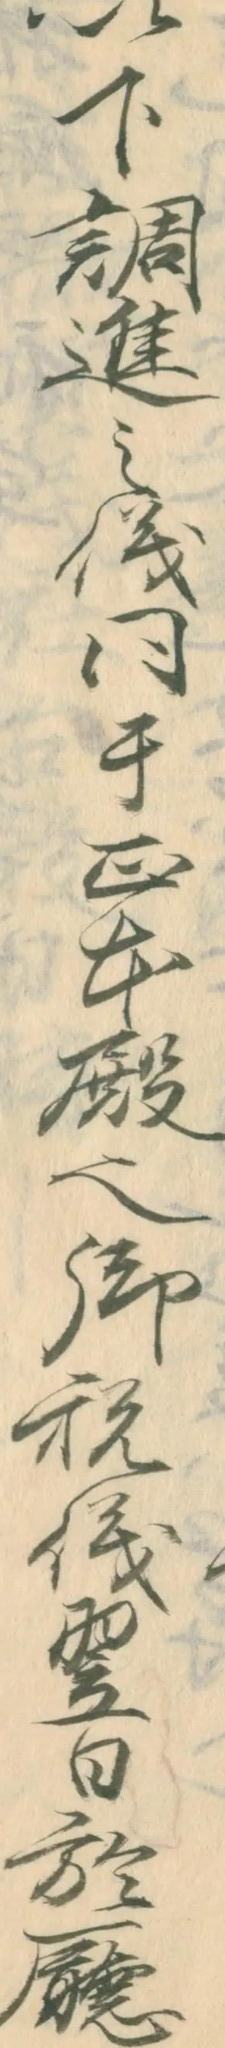以下調進之儀同于正本殿也御祝儀翌日於庁

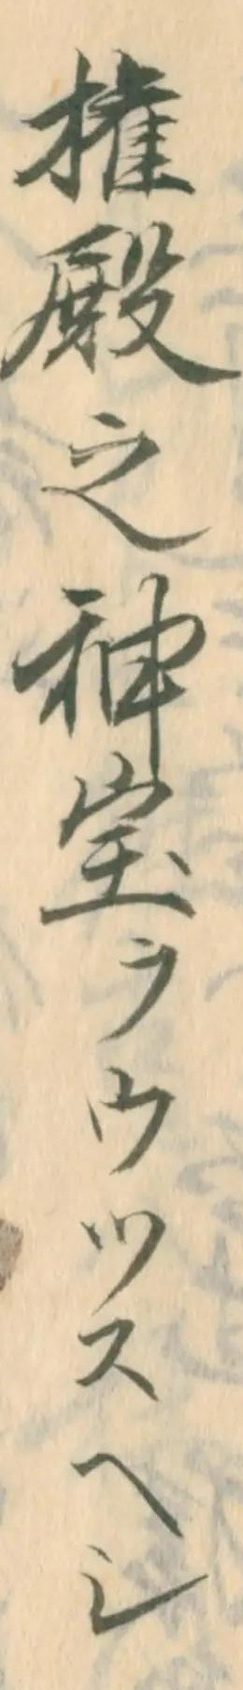権殿之神宝ヲウツスヘシ
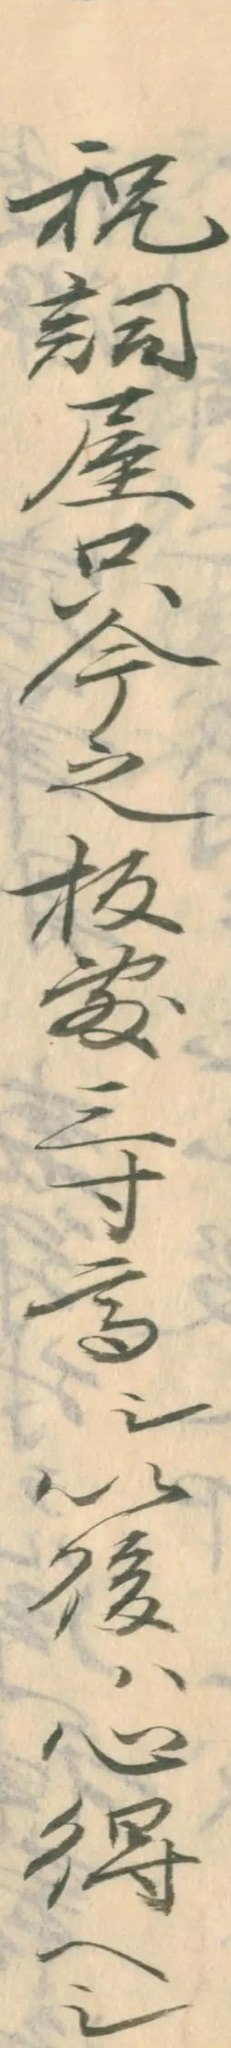一祝詞屋只今之板敷三寸高シ以後ハ心得へシ
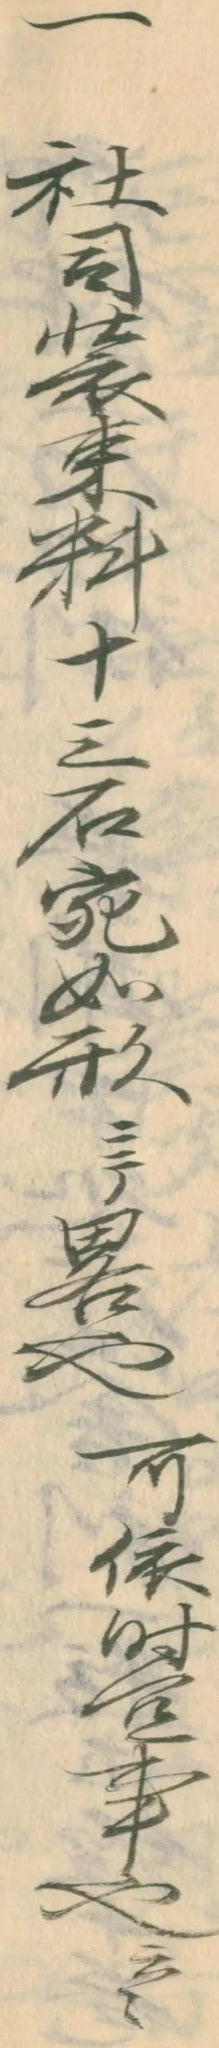一社司装束料十三石宛如形ニテ略也可依時宜事也云々
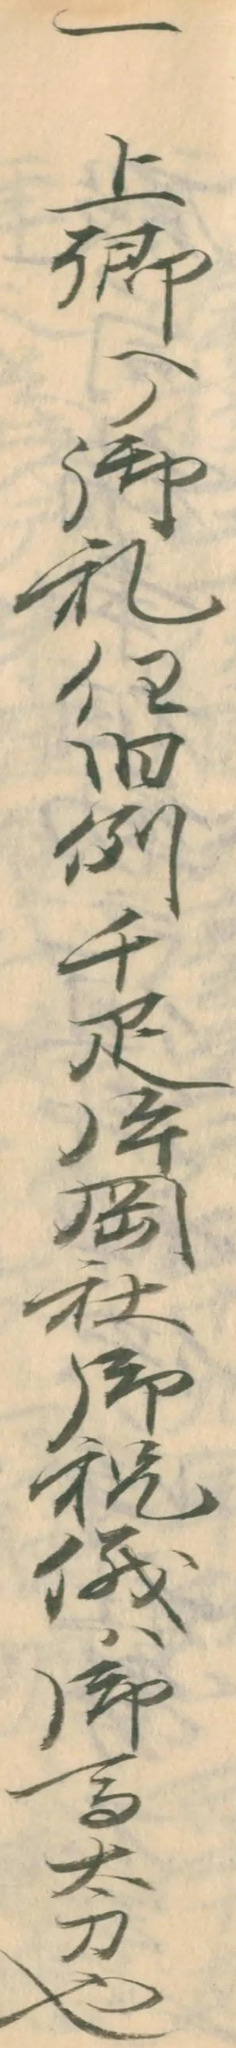一上卿ヘノ御礼任旧例千疋片岡社御祝儀ハ御馬太刀也
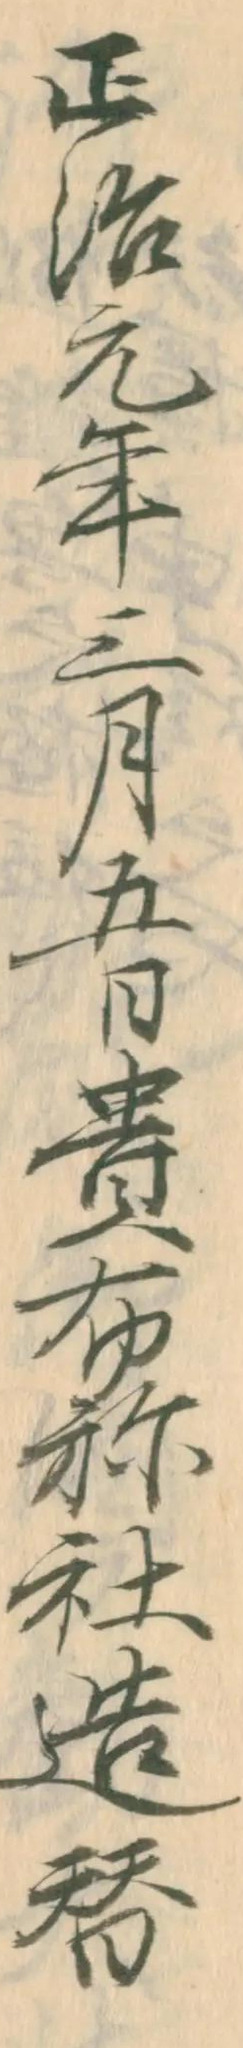正治元年三月五日貴布祢社造替宣旨
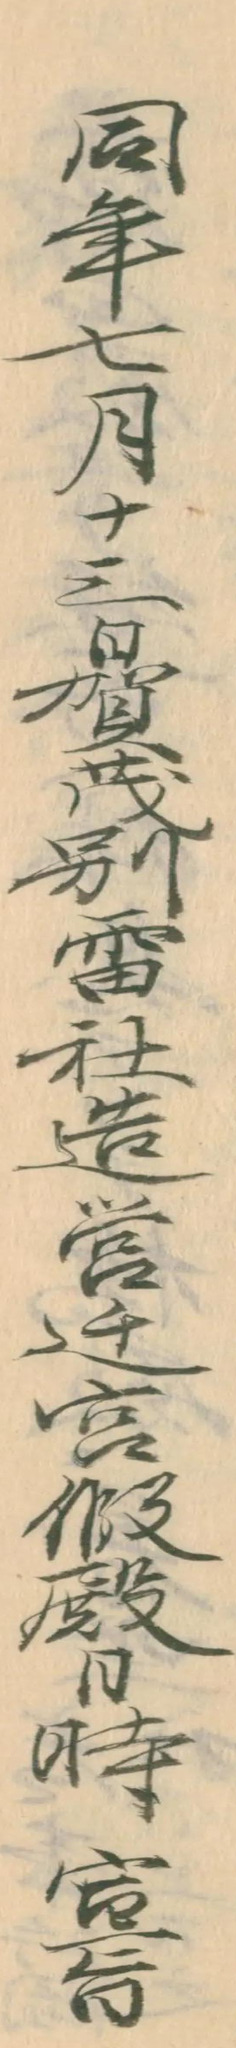一同年七月十三日賀茂別雷社造営迁宮仮殿日時宣旨
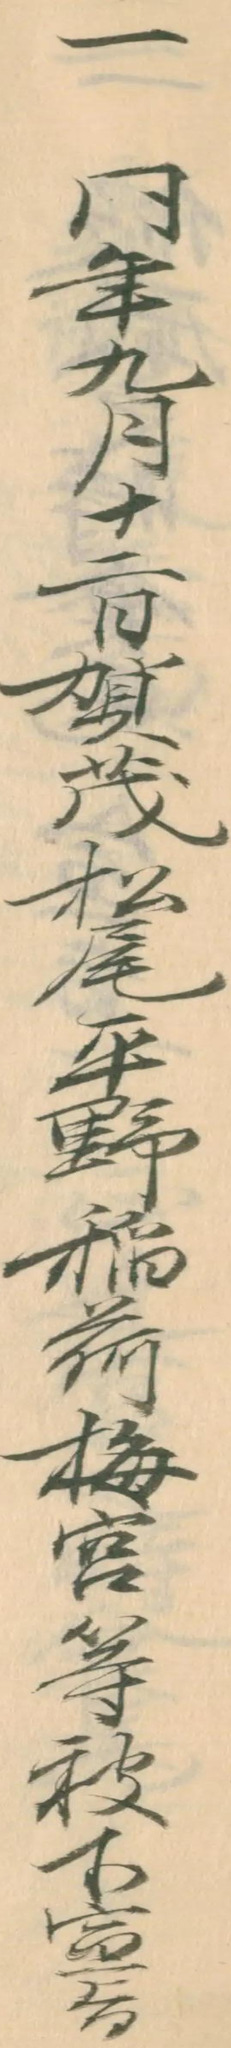一同年九月十二日賀茂松尾平野稲荷梅宮等被下宣旨
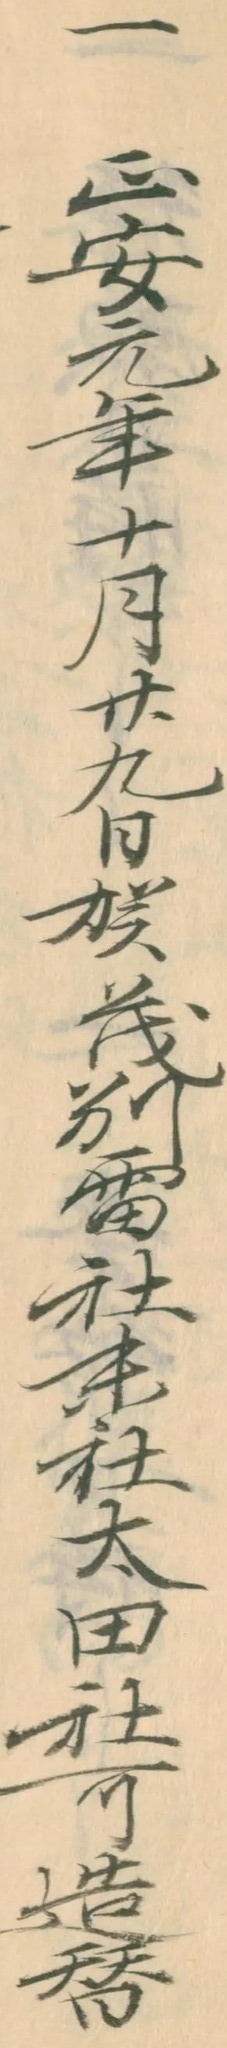一正安元年十月廿九日賀茂別雷社末社太田社可造替
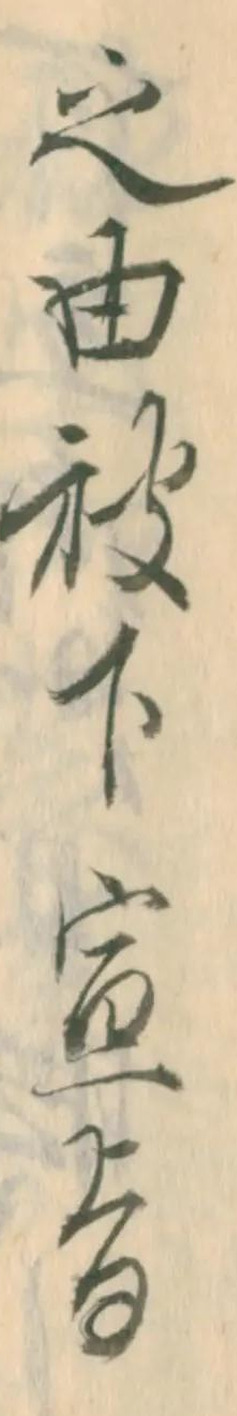之由被下宣旨
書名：賀茂社記録. 第15冊
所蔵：国立国会図書館 National Diet Library, JAPAN
